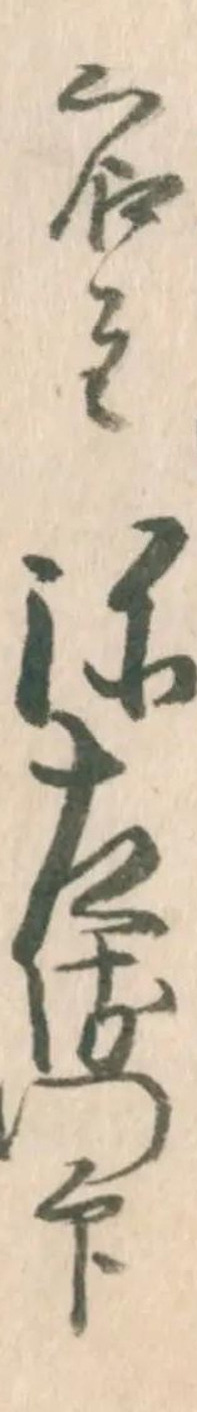名主弥左衛門印

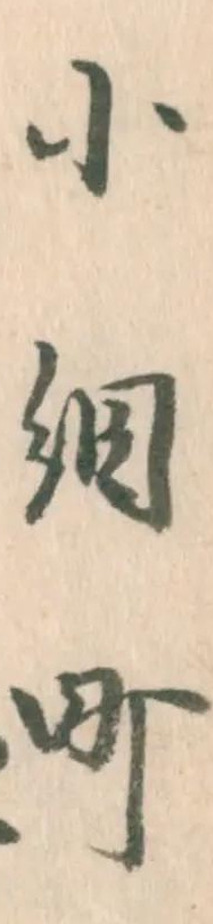小網町
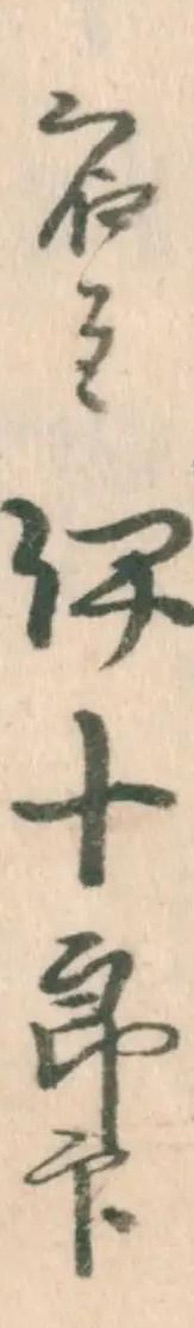名主伊十郎印
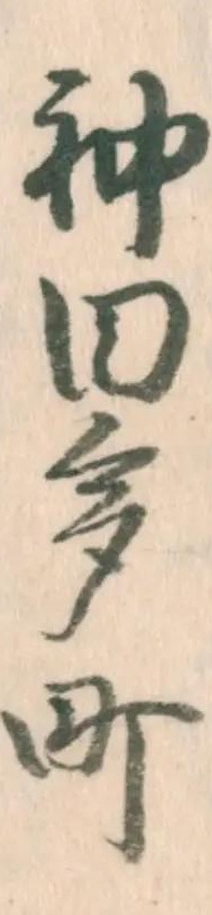神田多町
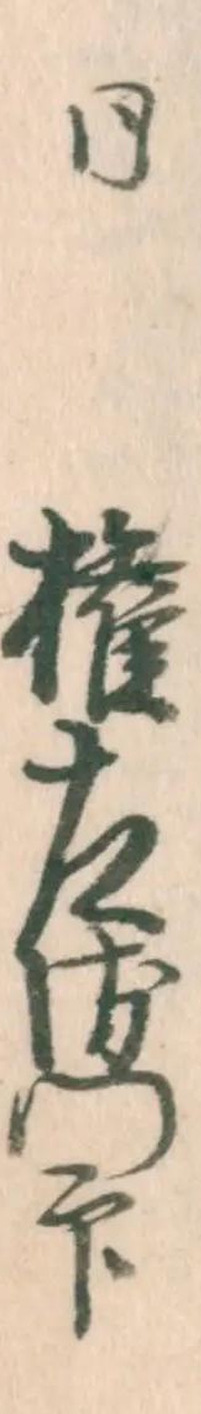同権左衛門印
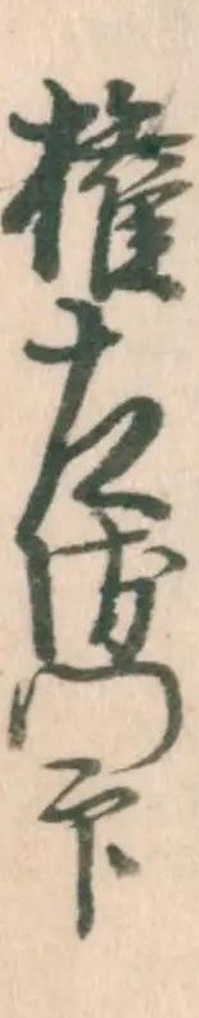同権左衛門印
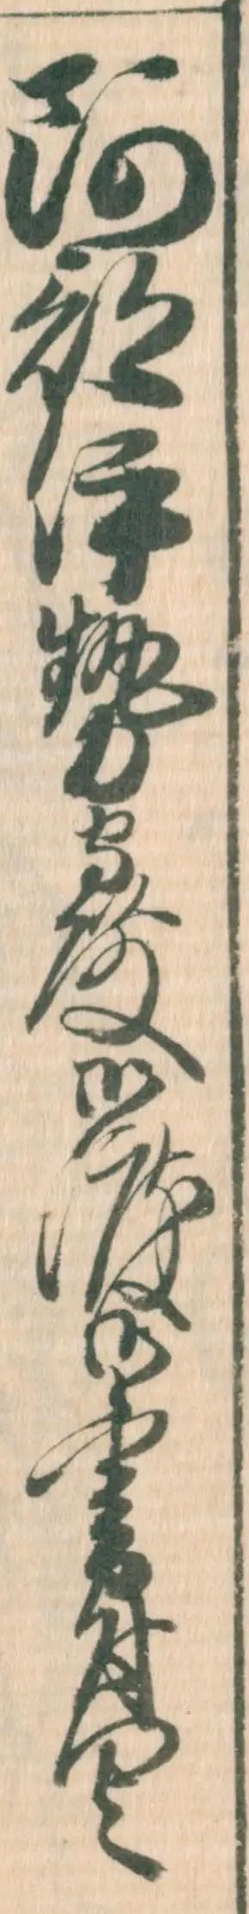│阿部伊勢守殿御渡御書付写
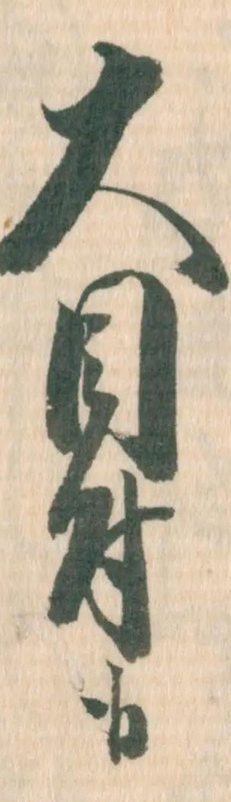│大目付え
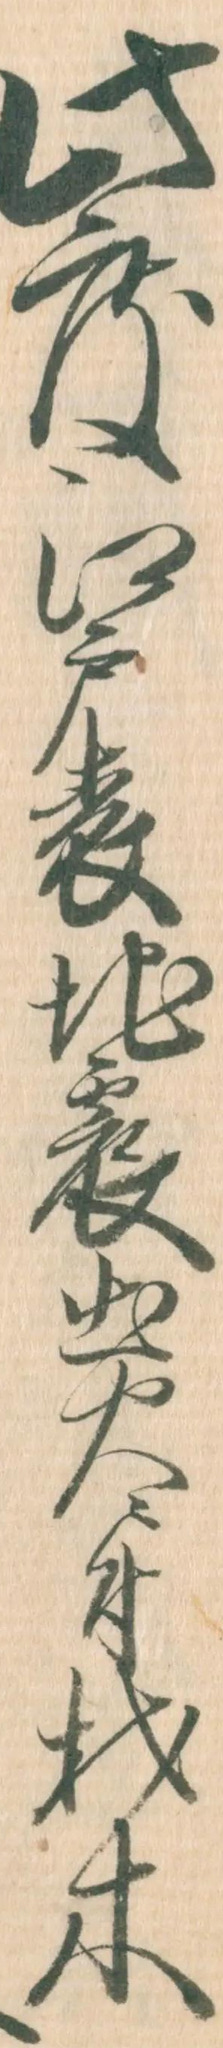此度江戸表地震出火ニ付材木
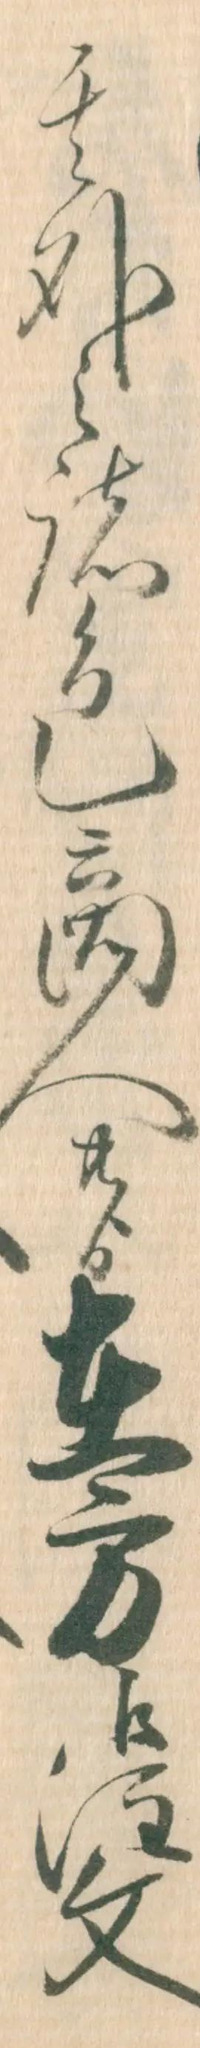其外之諸色商人共ゟ在方え注文
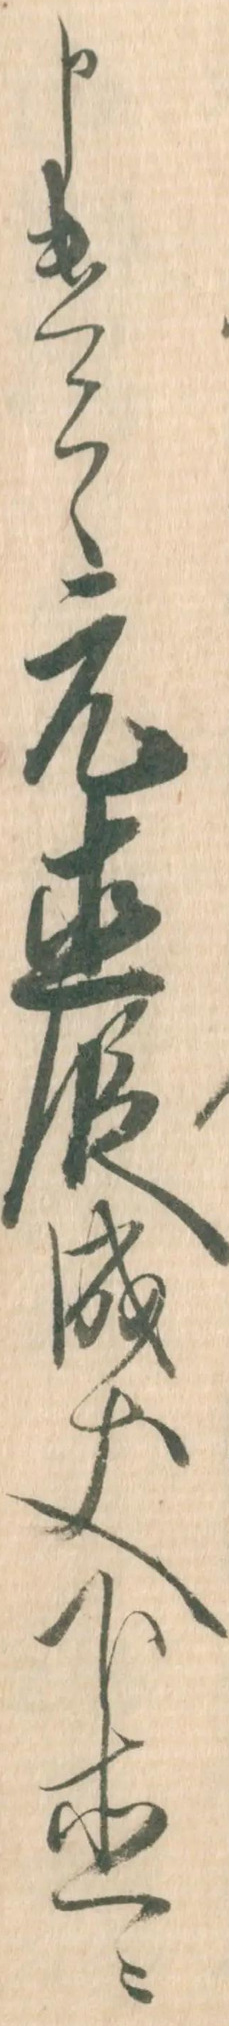申遣候ハヽ元直段成丈下直ニ

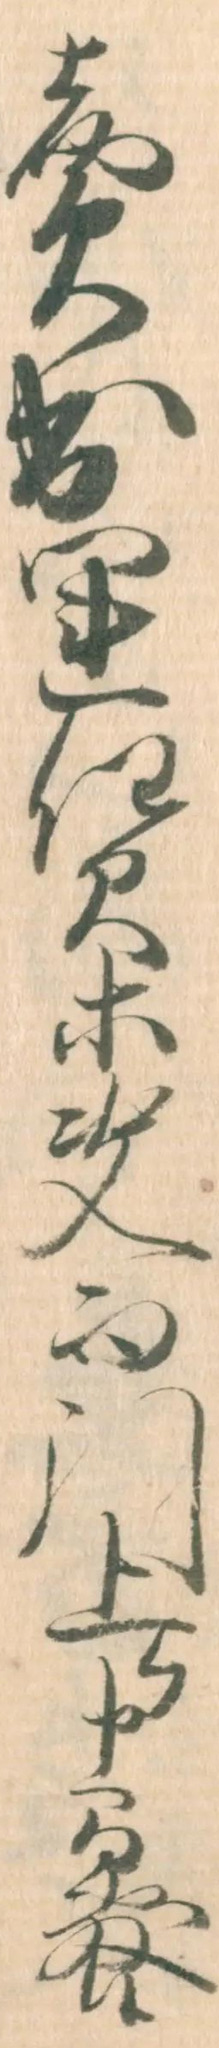売出運賃等決て引上ケ申間敷候
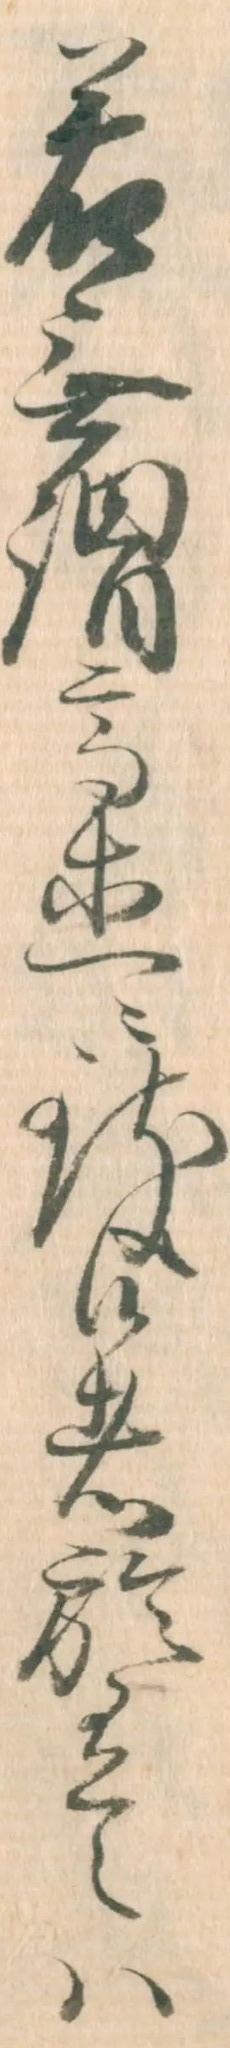若無謂高直ニ致候者於有之ハ
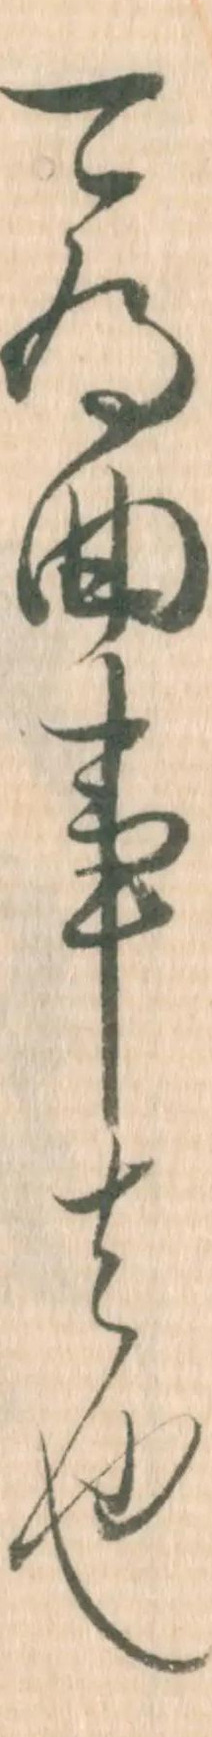可為曲事者也
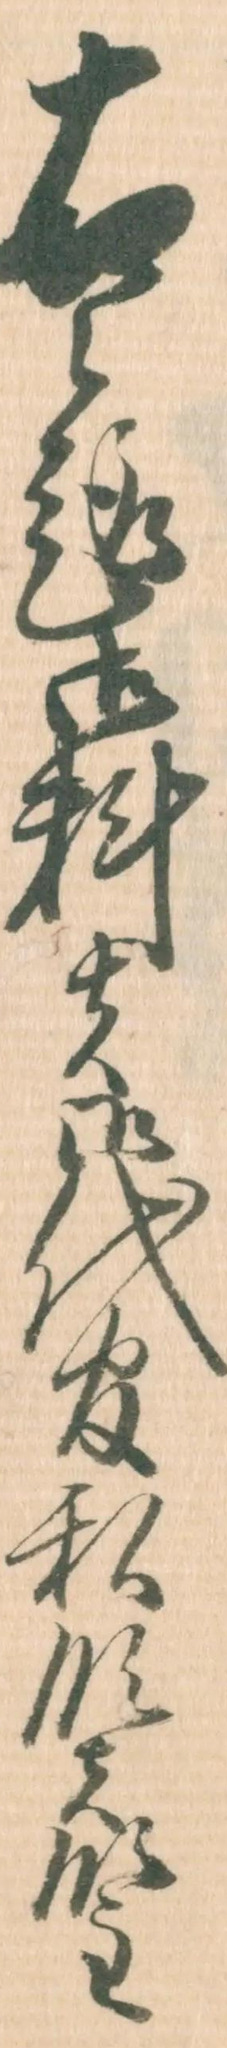右之趣御料は御代官私領は領主
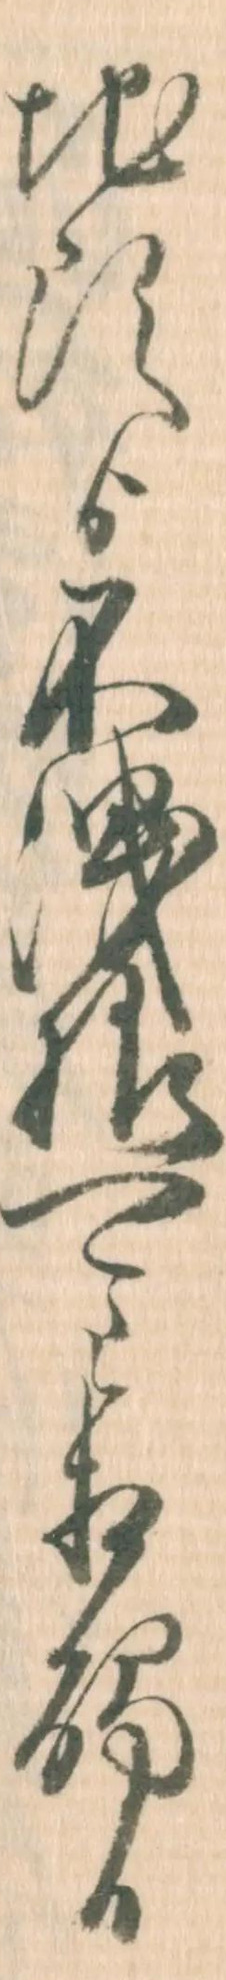地頭ゟ不洩様可被相触候
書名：地震災書留 2巻. [2] 内表紙に「地震一件　安政二卯年十月」とあり
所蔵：国立国会図書館 National Diet Library, JAPAN
